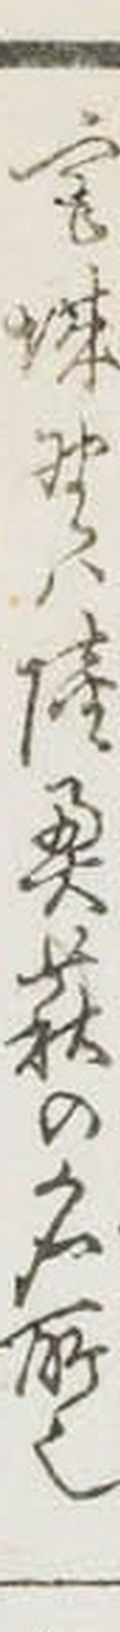宮城野は陸奥萩の名所也
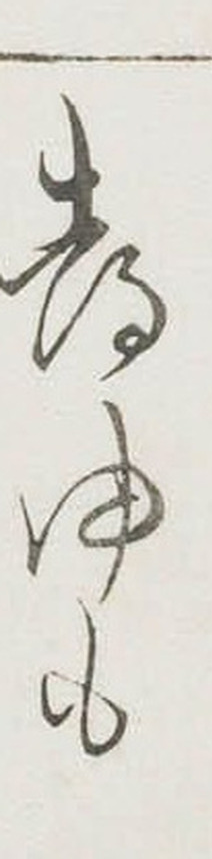つゆも
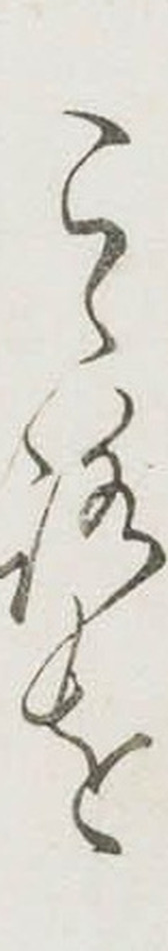こゝろを
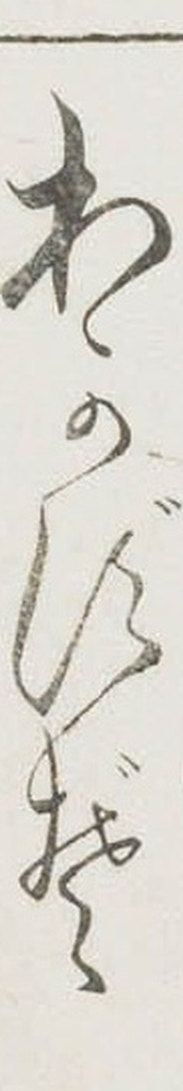わかずぞ
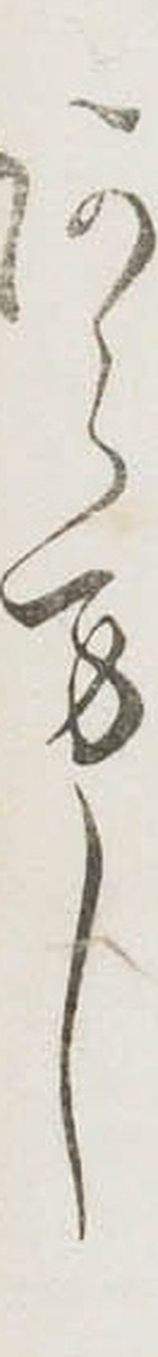あらまし
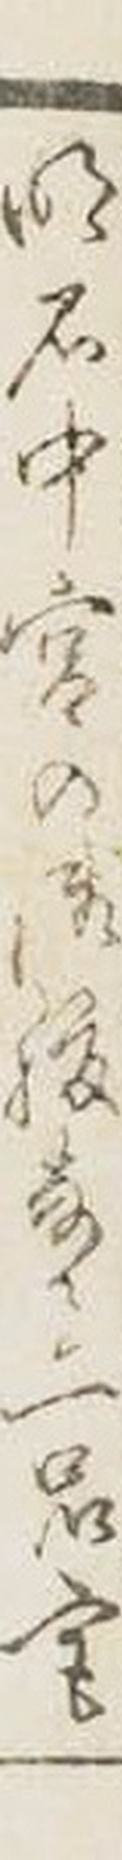明石中宮の御腹なる一品宮
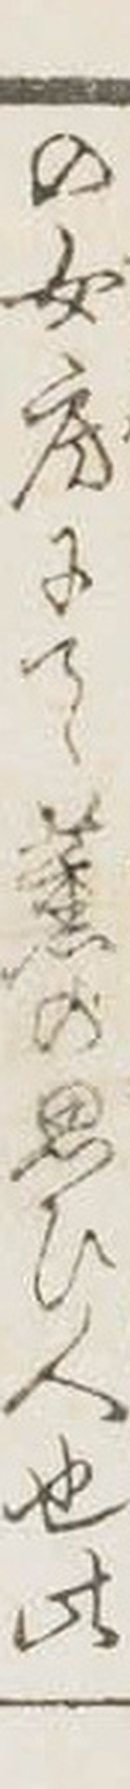の女房にて薫の思ひ人也此
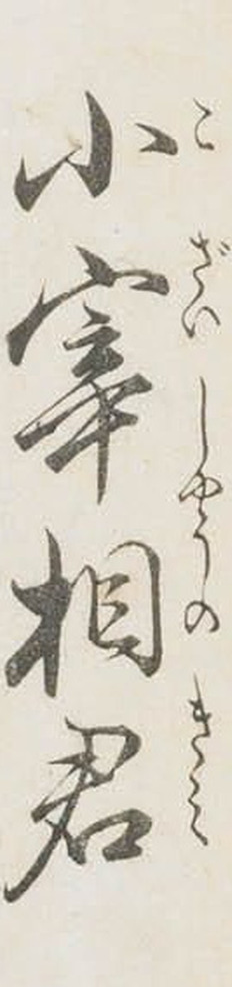小宰相君
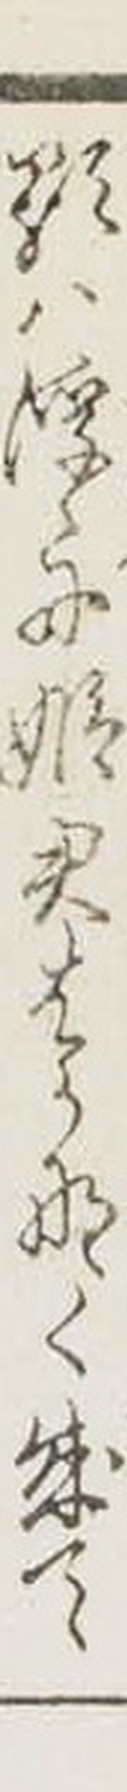歌は浮舟姫君はかなく成て
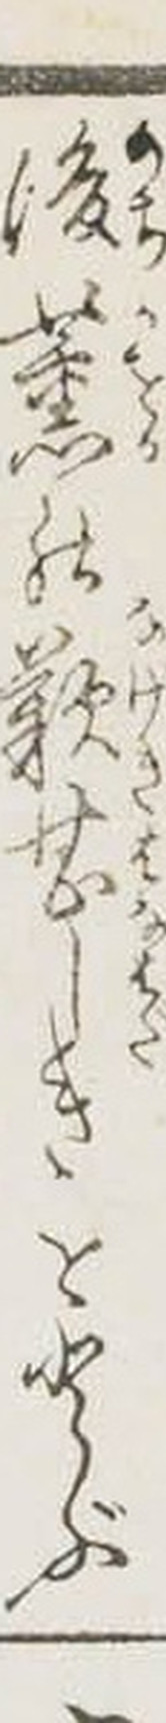後薫の歎甚しきととぶ
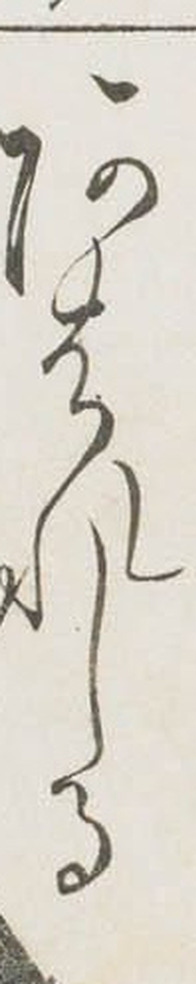あはれしる
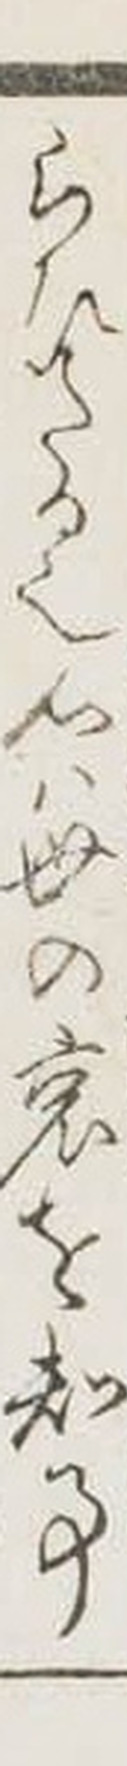らひたる也心は世の哀を知事
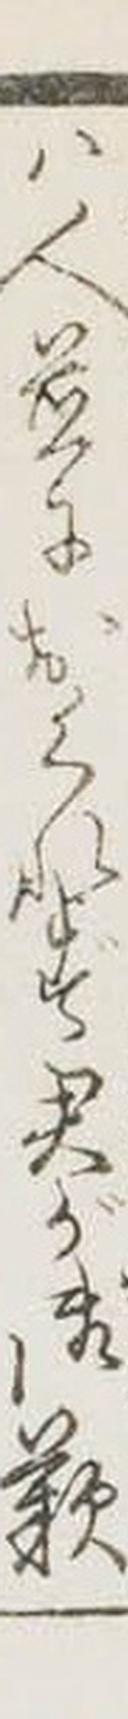は人並におくれず君が御歎
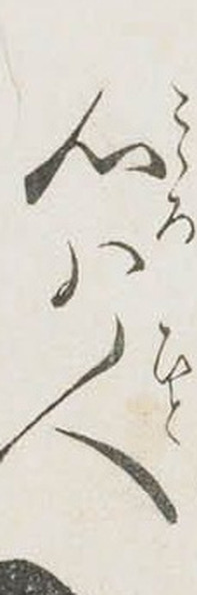心は人
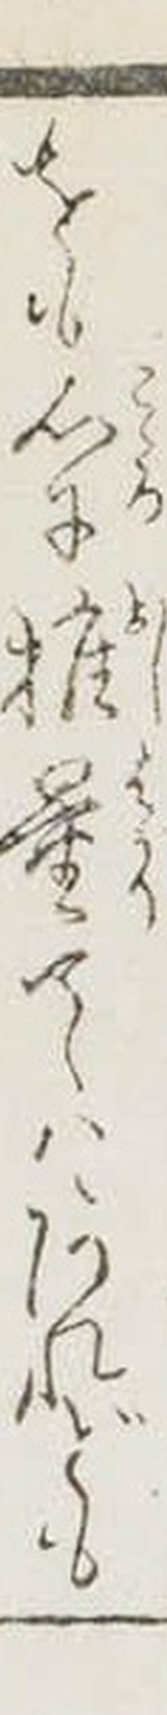をも心に推量てはあれども
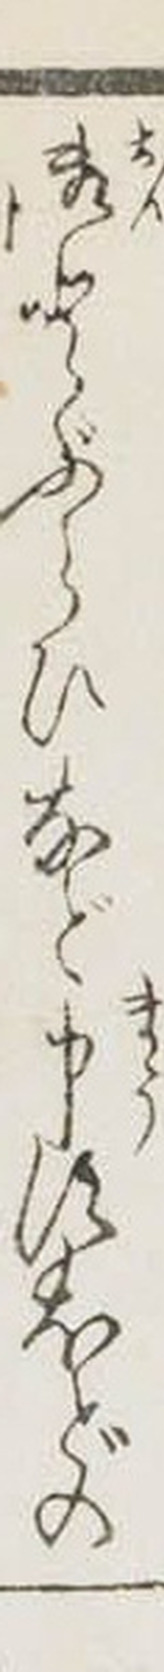御とぶらひなど申すほどの
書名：源氏百人一首
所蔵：東京学芸大学教育コンテンツアーカイブ
